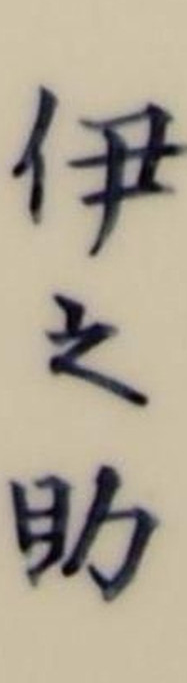伊之助
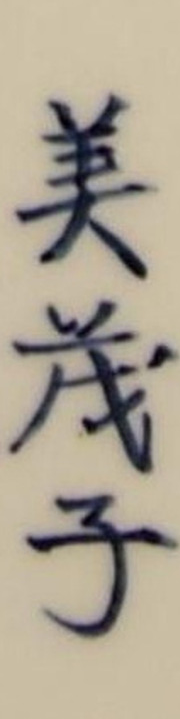美茂子
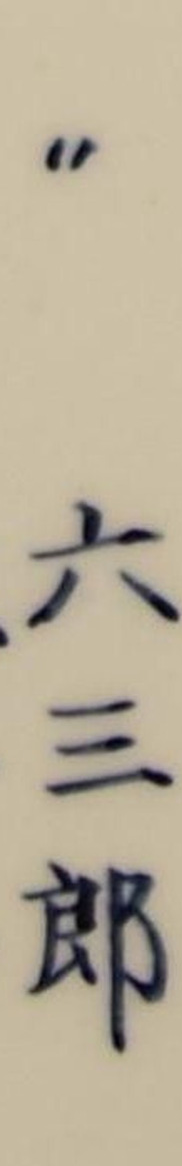六三郎
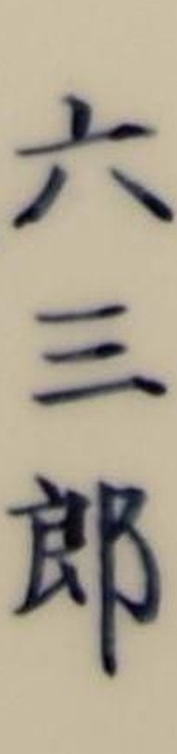六三郎
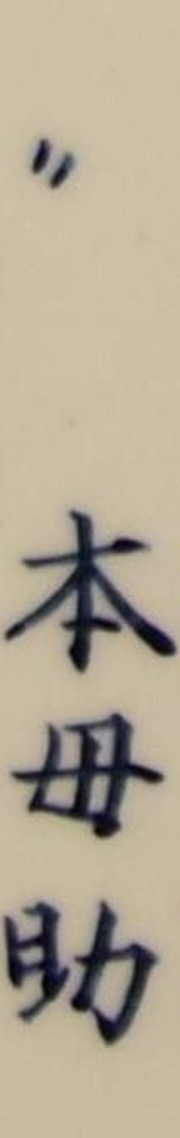本母助
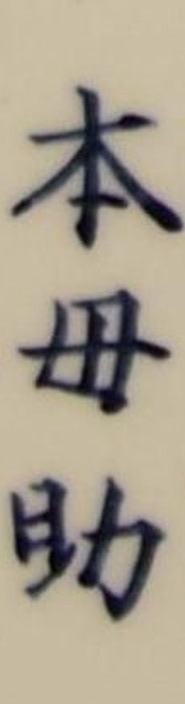本母助
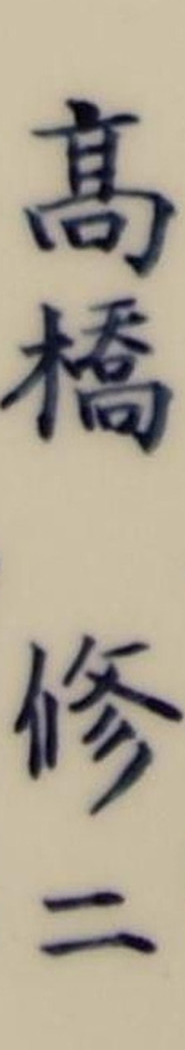高橋修二
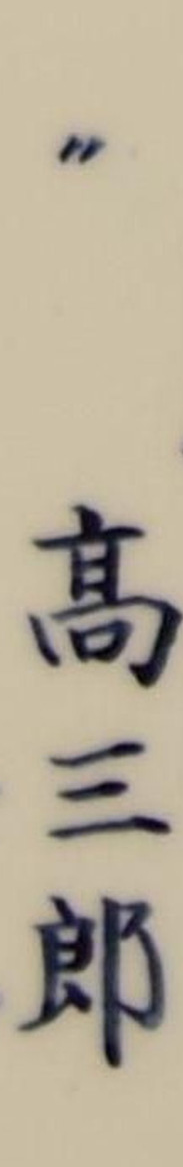高三郎
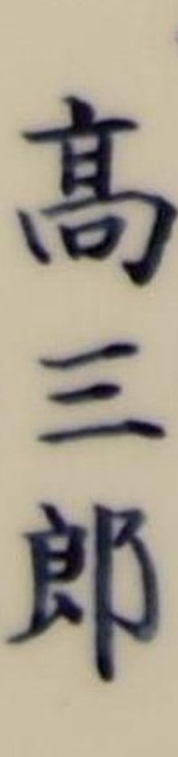高三郎
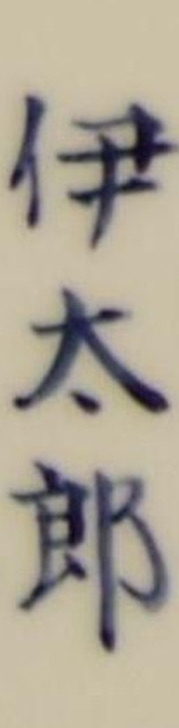伊太郎

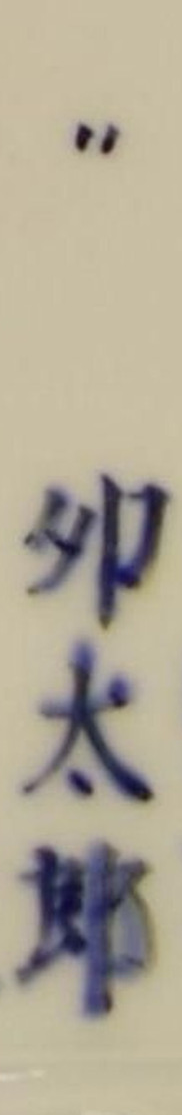卯太郎
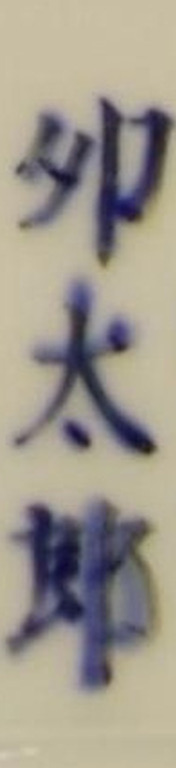卯太郎
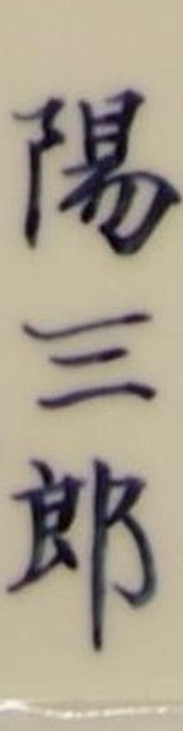陽三郎
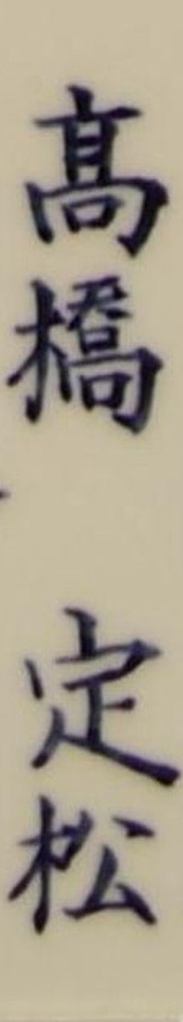高橋定松
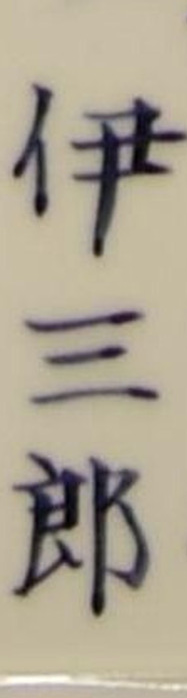伊三郎
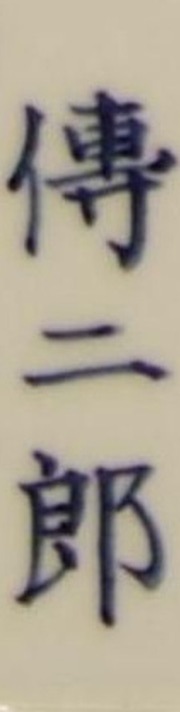伝二郎
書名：A~D
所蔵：koyasan kongobuji
